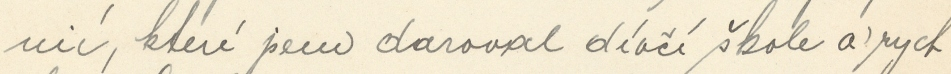nií, které jsem daroval dívčí škole a rych-
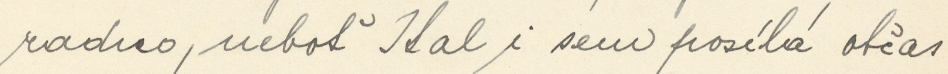radno, neboť Ital i sem posílá občas
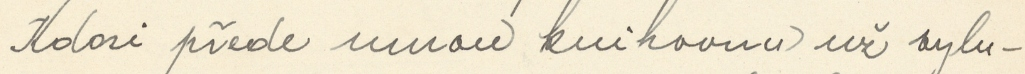Kdosi přede mnou knihovnu už vylu-
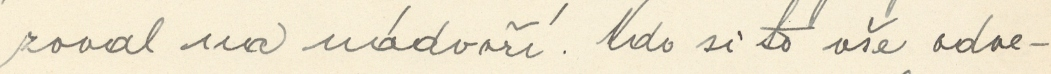zoval na nádvoří. Kdo si to vše odve-
